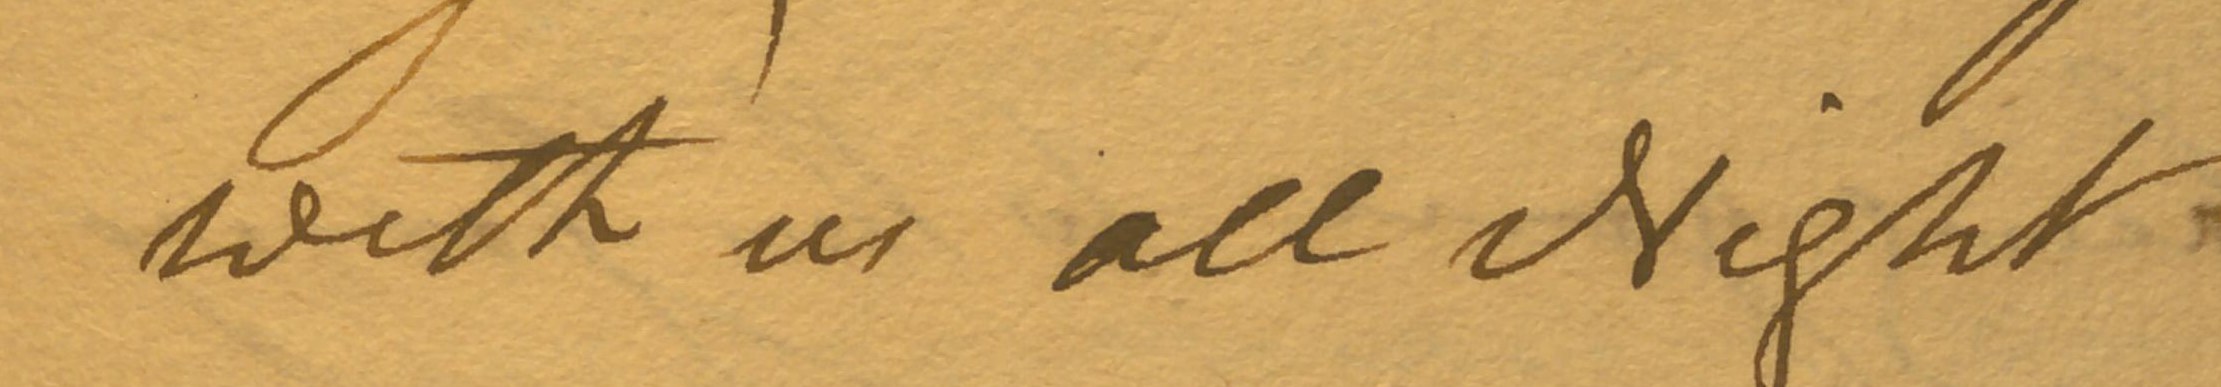with us all Night
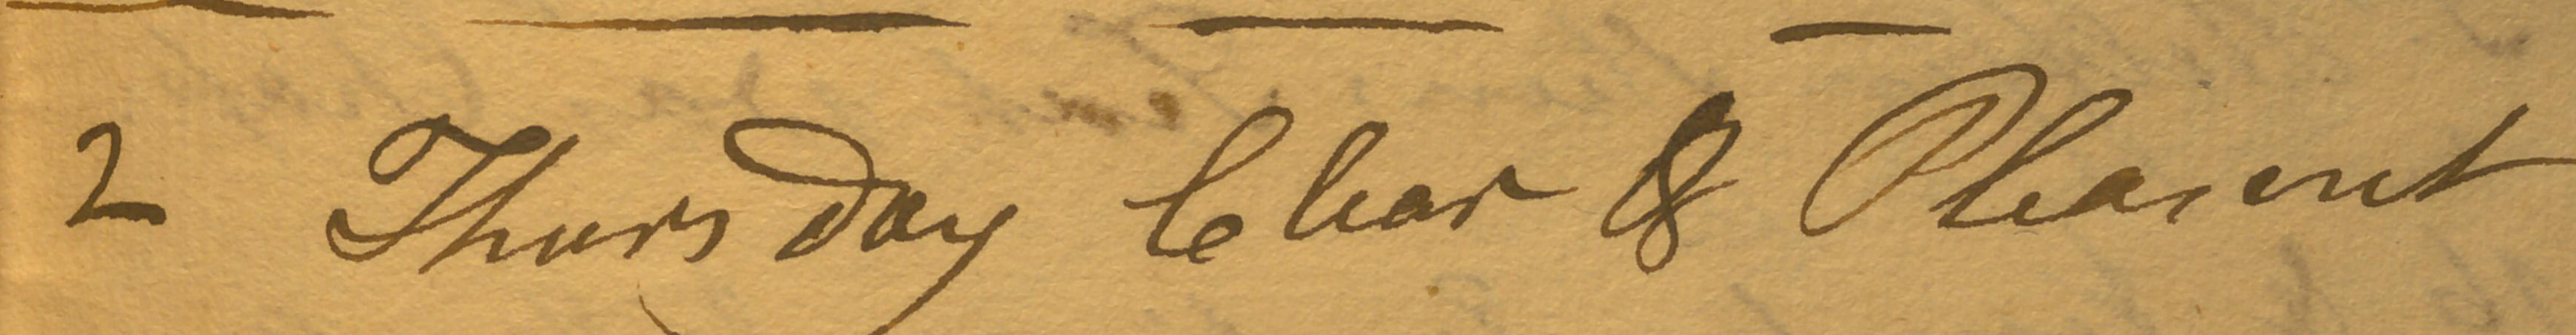2 Thursday Clear & Pleasent
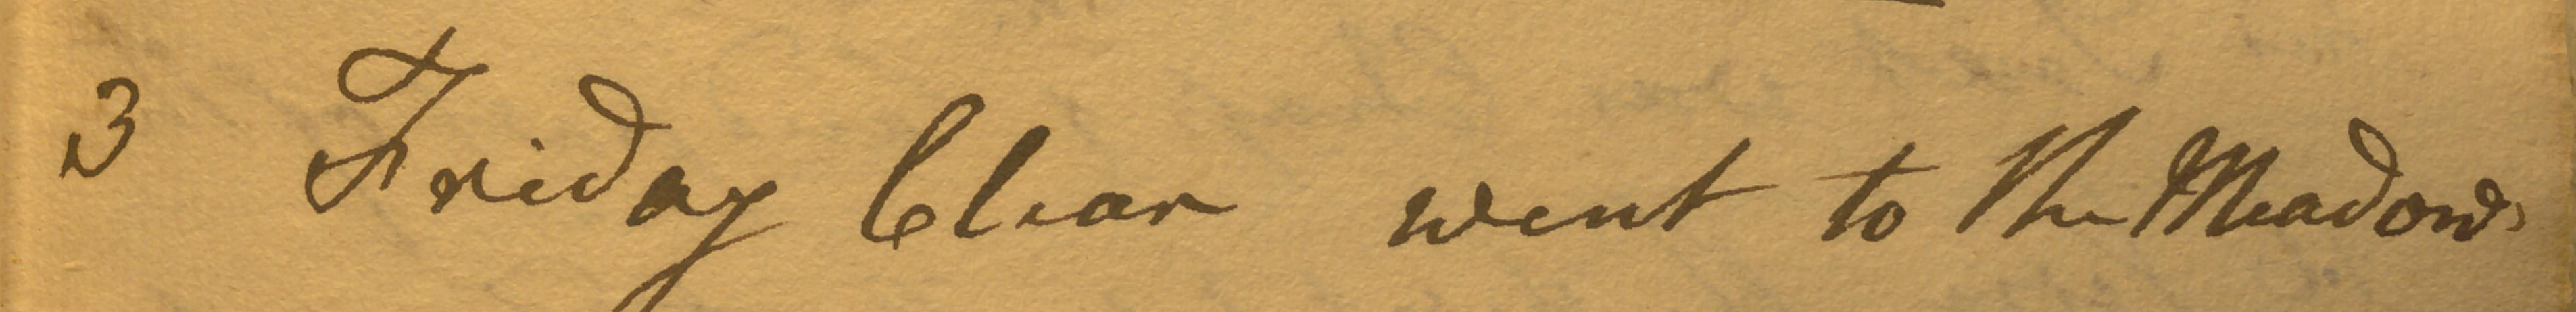3 Friday Clear went to the Meadow
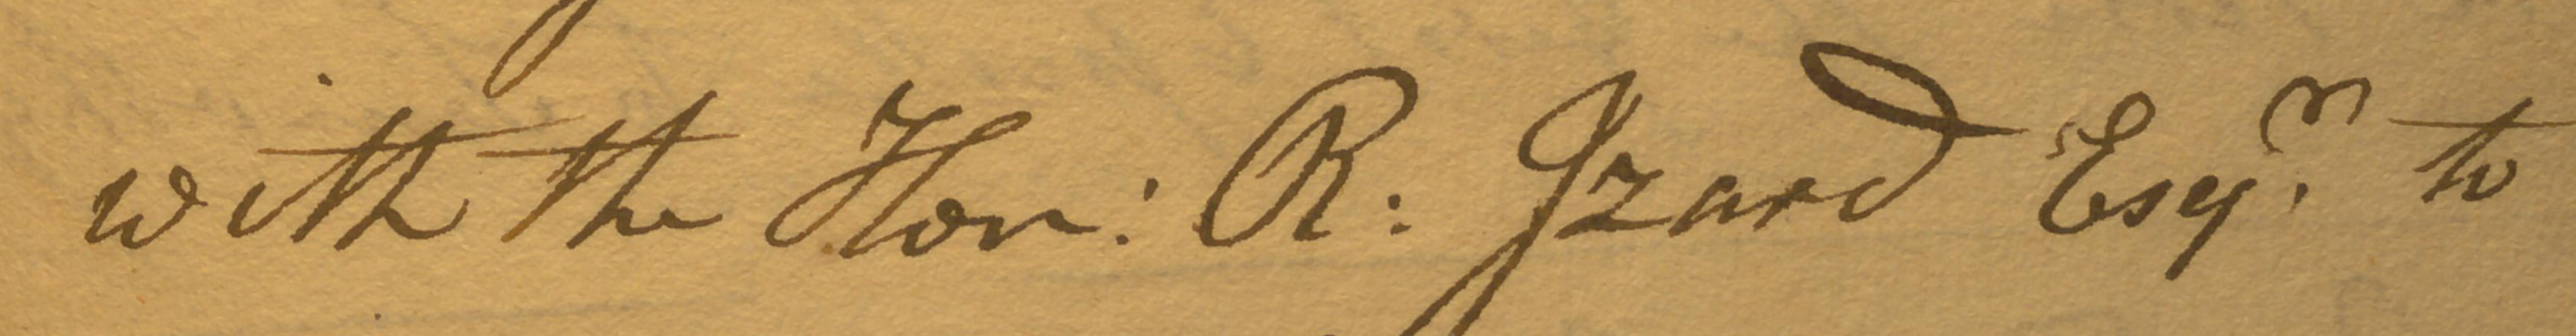with the Hon: R: Izard Esq^r. to
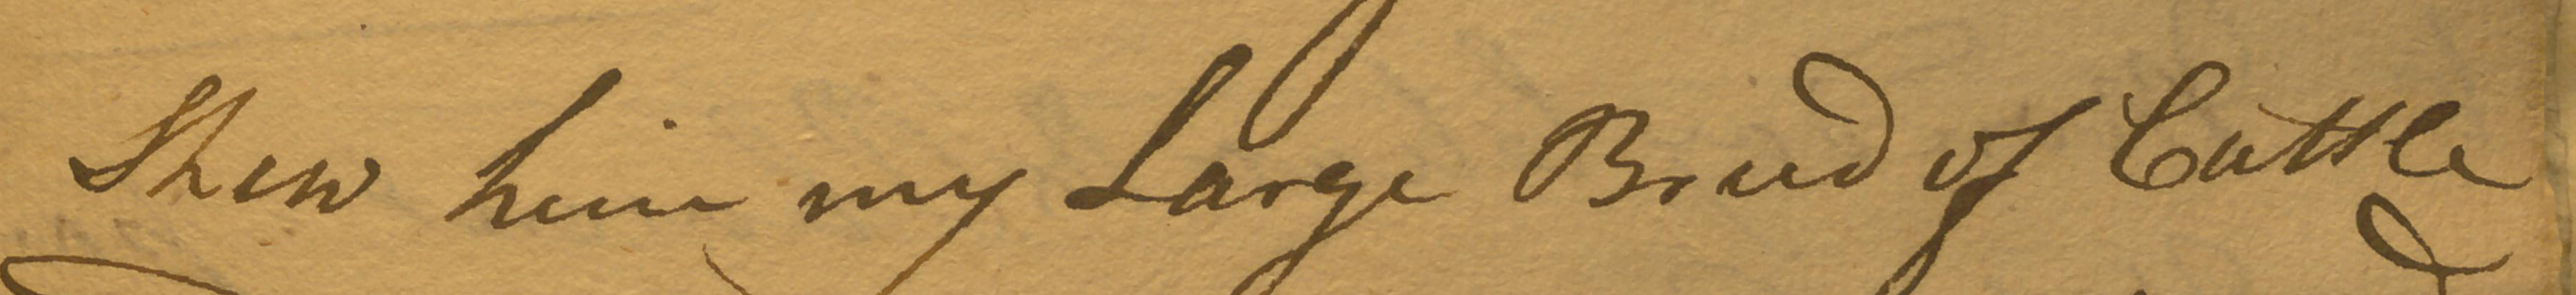Shew him my Large Breed of Cattle
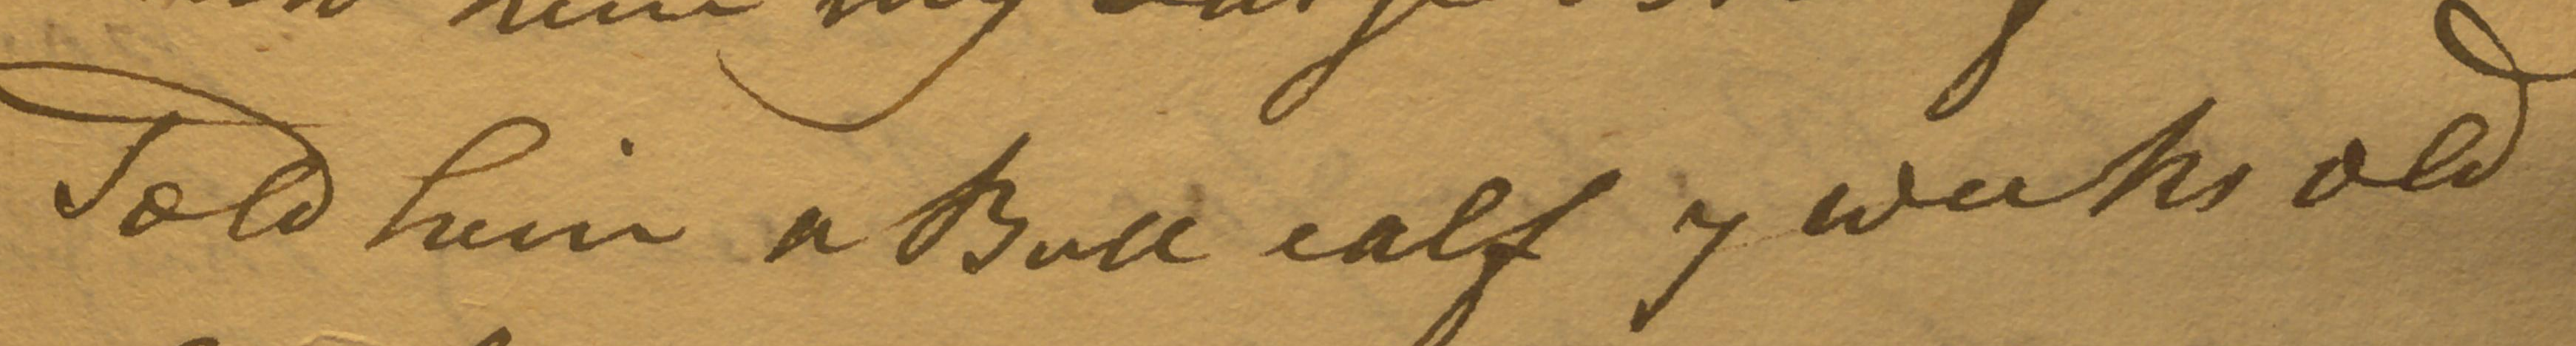Sold him a Bull calf 7 weeks old
